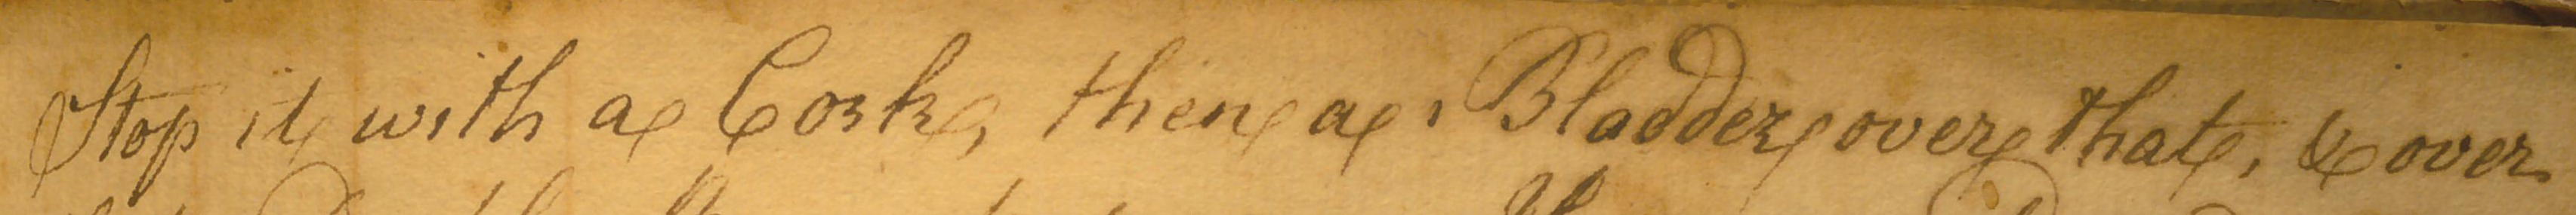Stop it with a Cork, then a Bladder over that, & over
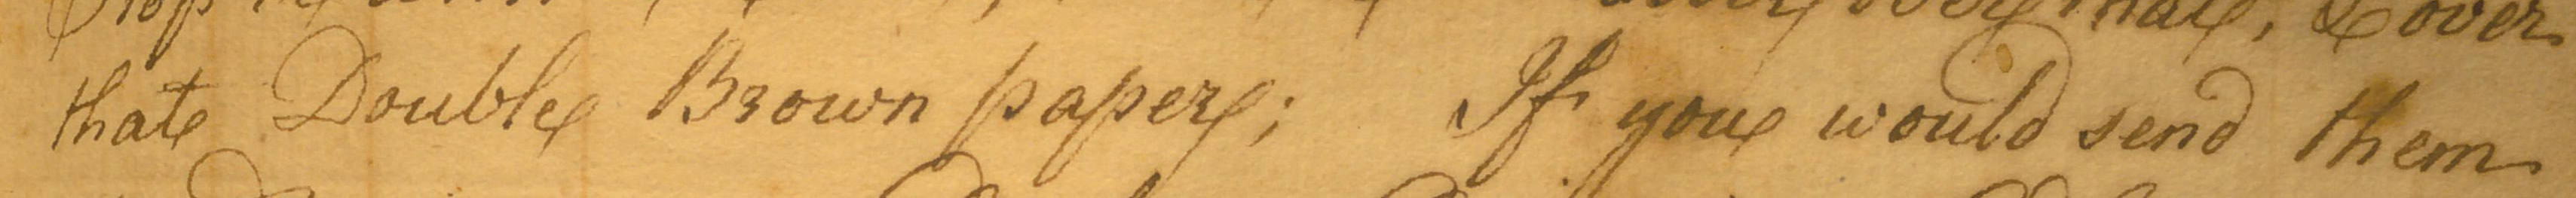that Double Brown paper; If you would send them
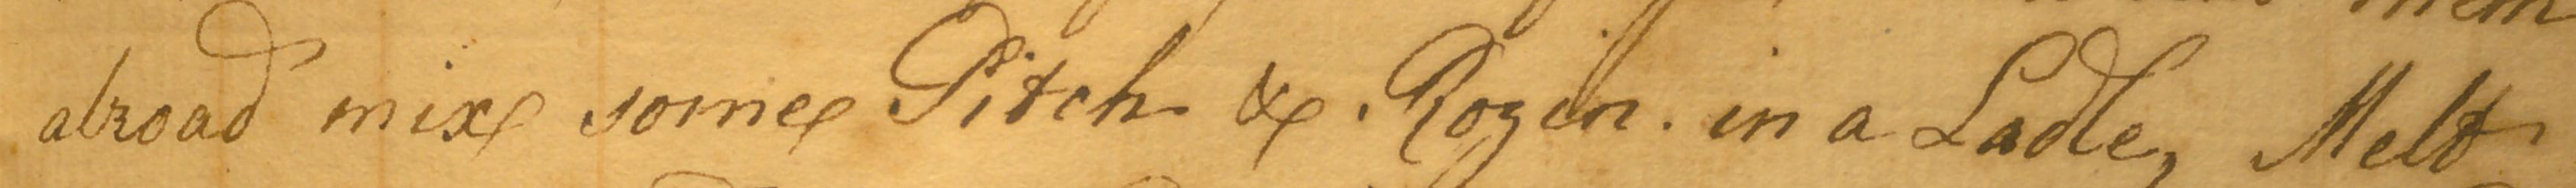abroad mix some Pitch & Rozin in a Ladle, Melt
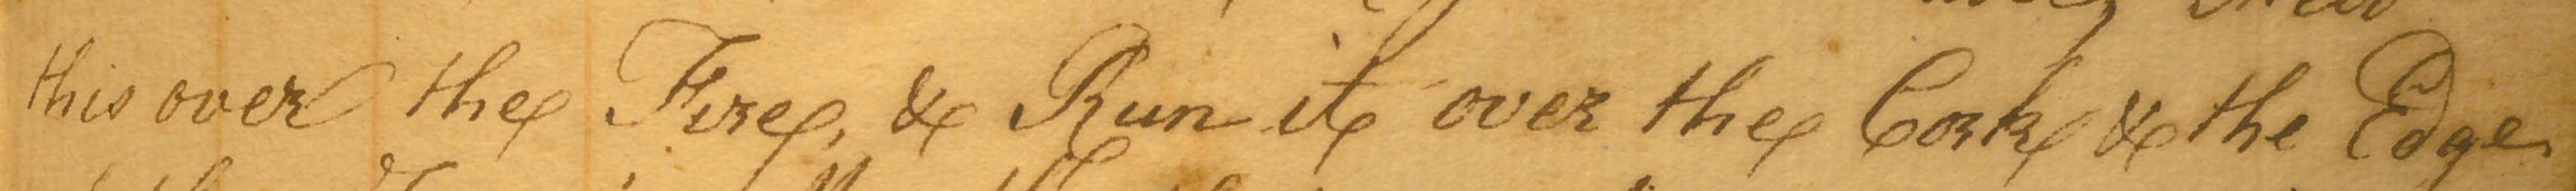this over the Fire, & Run it over the Cork & the Edge
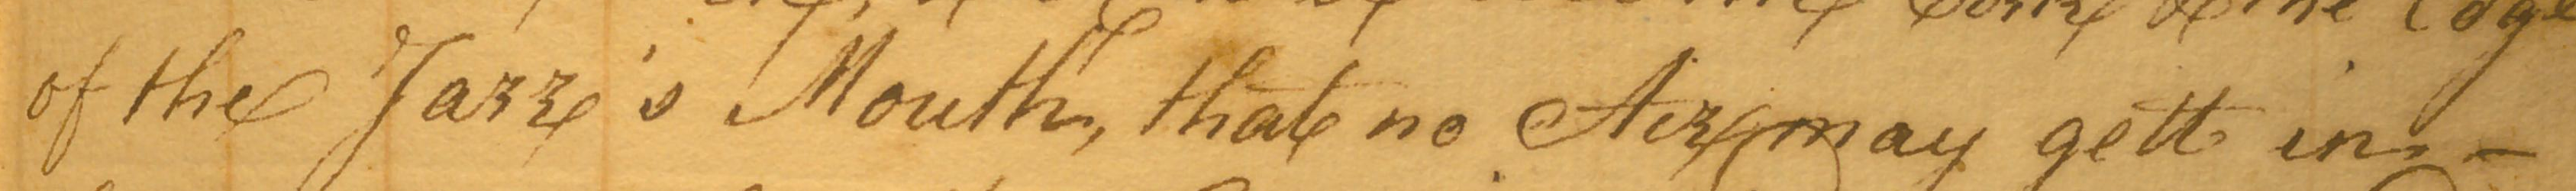of the Jarr's Mouth that no Air may gett in-
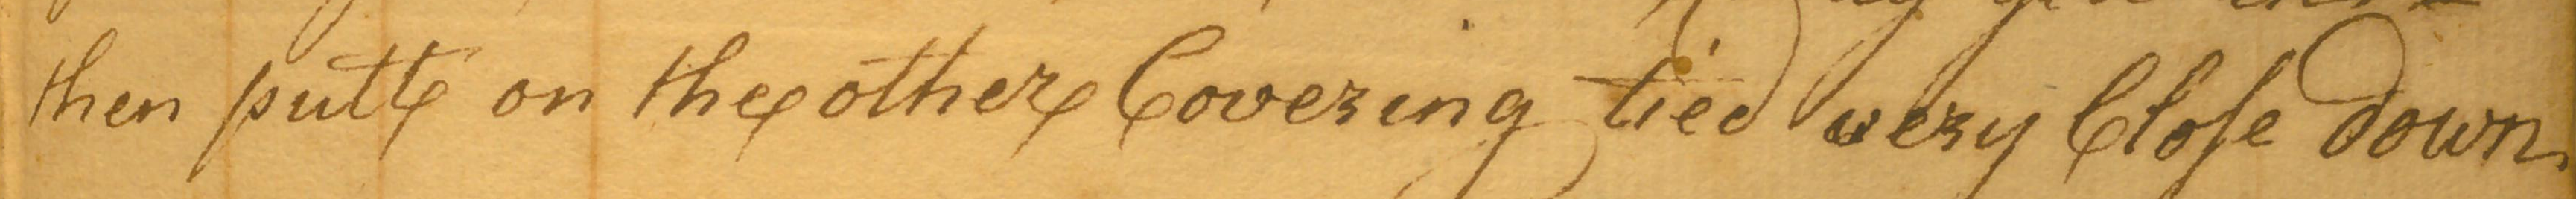then putt on the other Covering tied very Close down
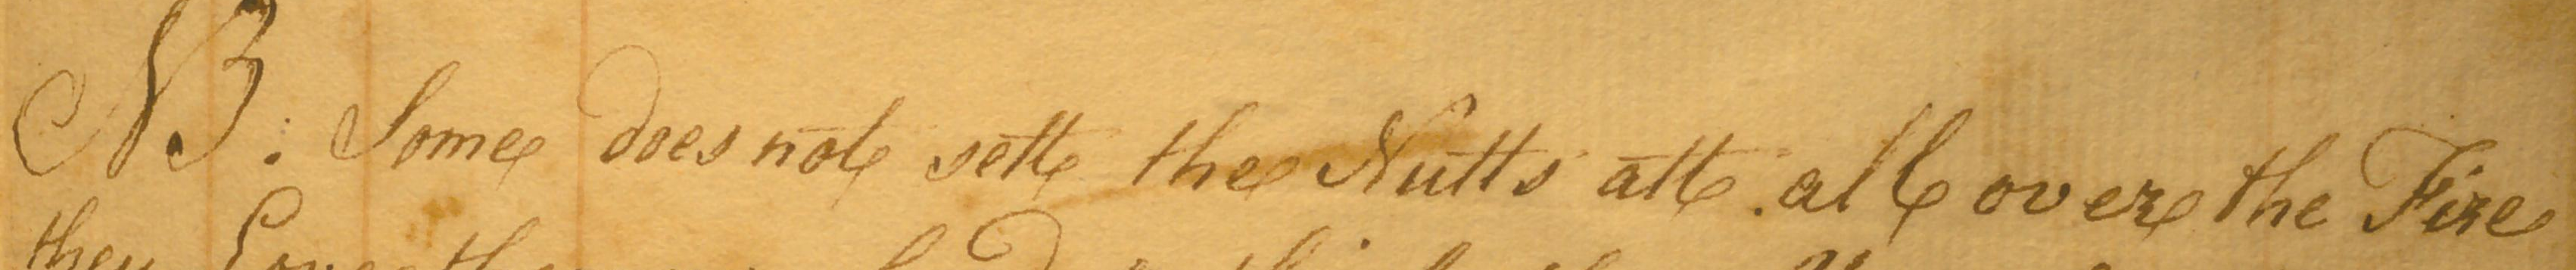NB. Some does not sett the Nutts att all over the Fire
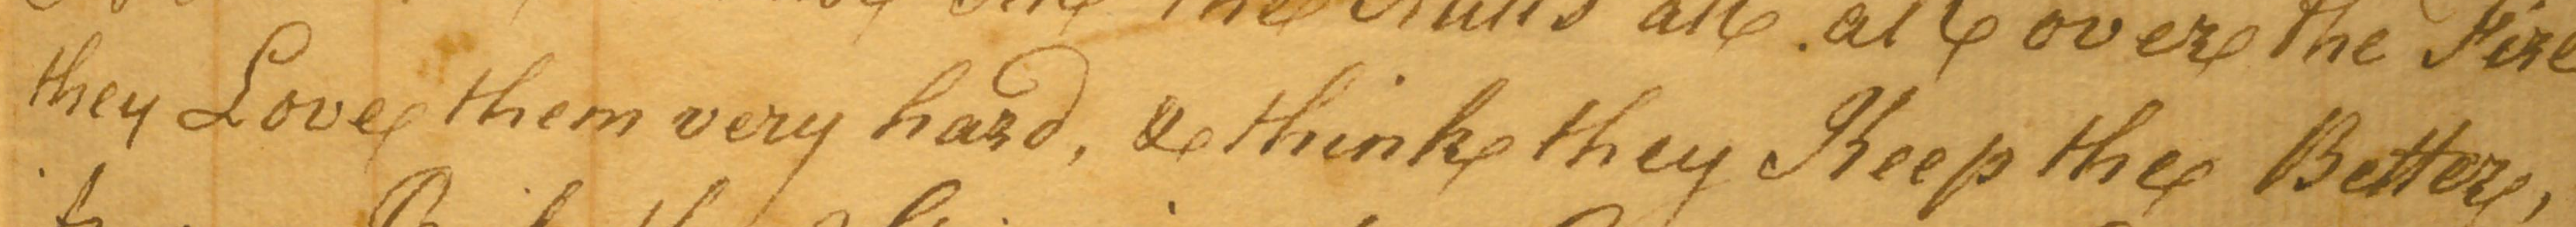they Love them very hard, & think they Keep hte Better,
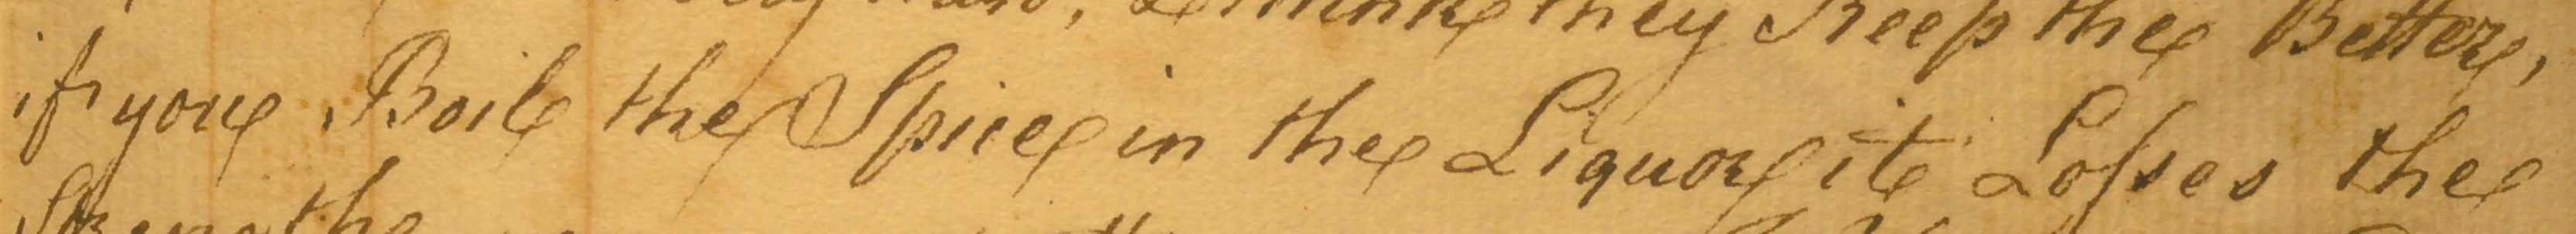if you Boil the Spices in the Liquor it Losses the
